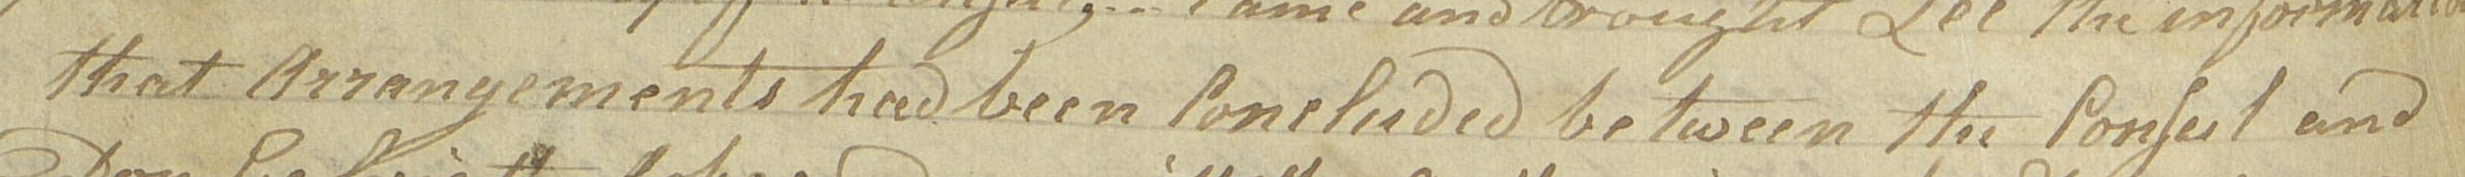that Arrangements had been concluded between the Consul and
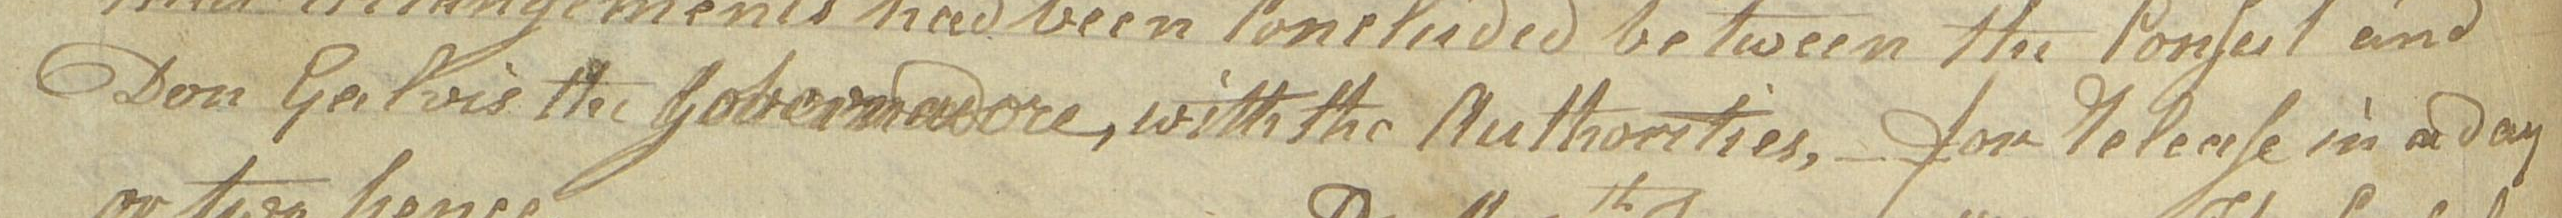Don Galvis the Gobermadore, with the Authorties, for release in a day
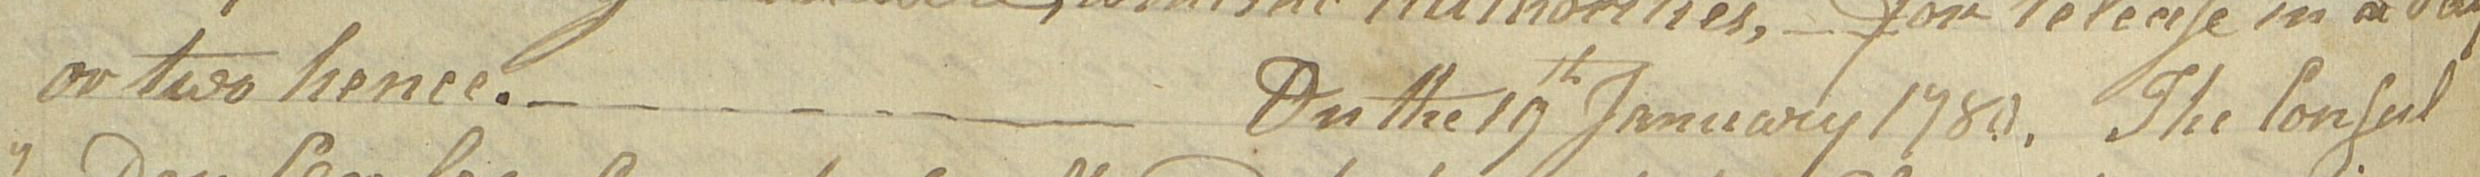or two hence. On the 19^th January 1780. The Consul
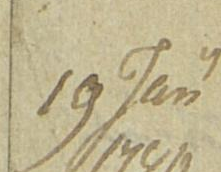19 Jan^y
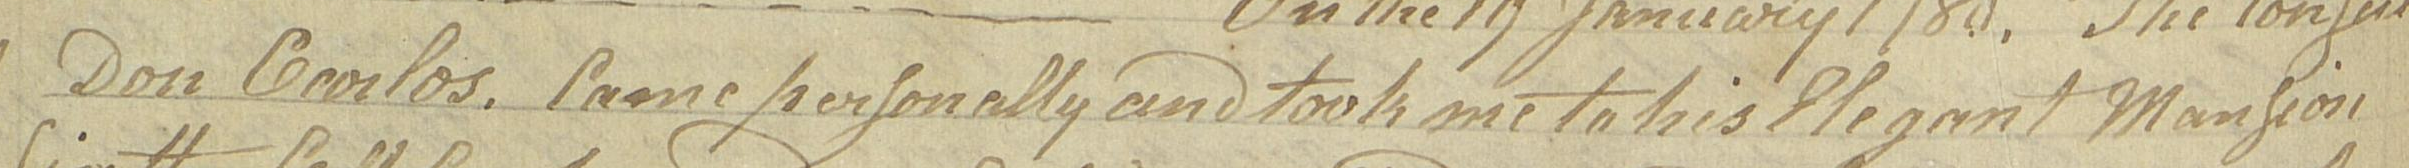Don Carlos. Came personally and took me to his Elegant Mansion
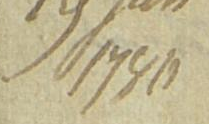1780
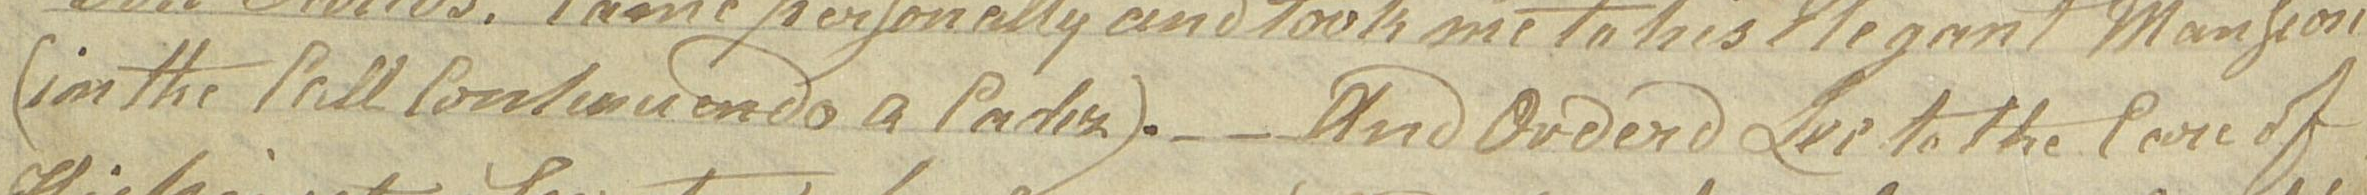(in the Call Contuendo a Cadiz). And Order'd Lee to the Care of
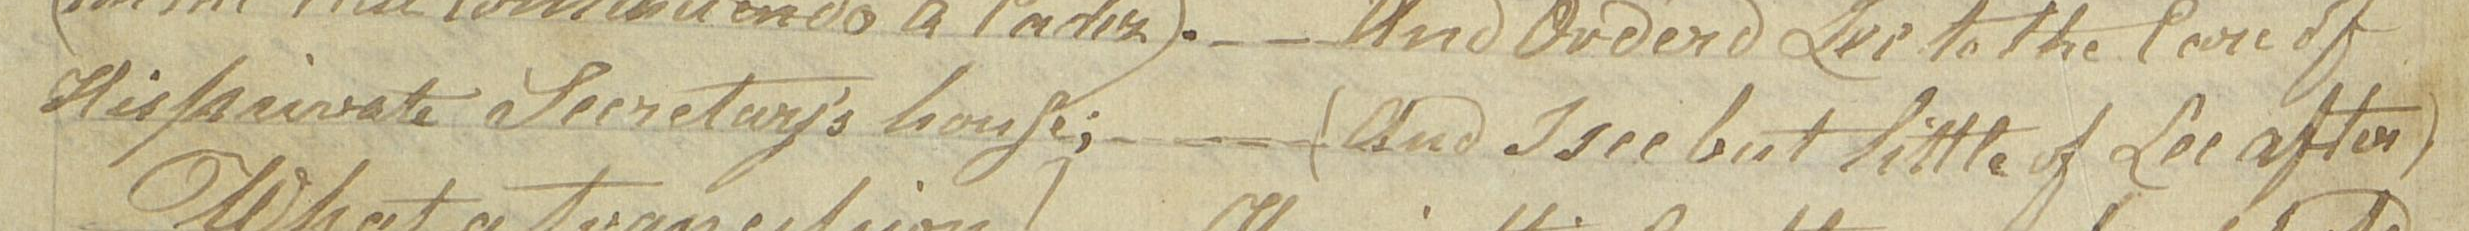His private Secretary's house; (And I see but little of Lee after)
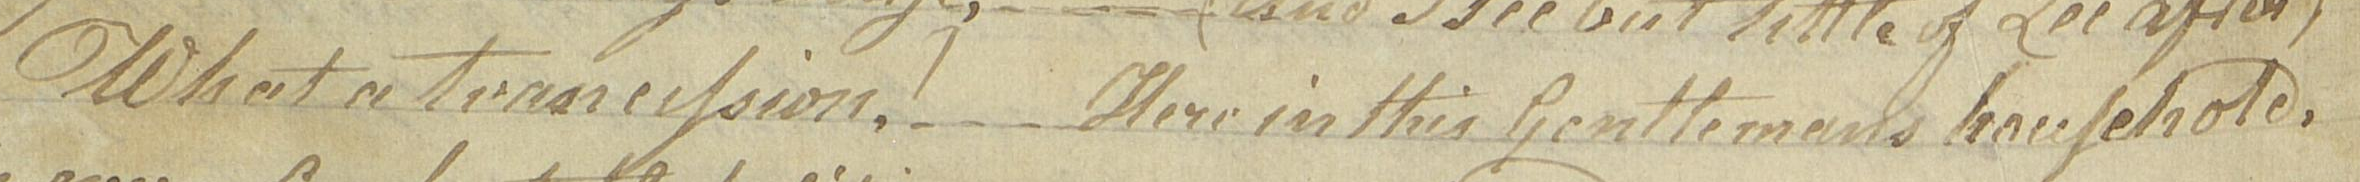What a trancession! Here in this Gentlemens household.
